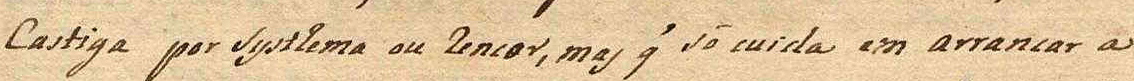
Castiga por Systhema ou Rencor, mas q̄ só cuida em arrancar a
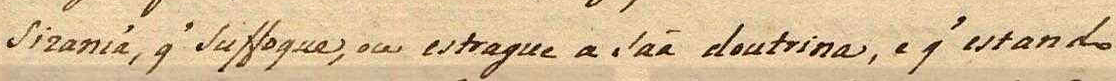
sizania, q̄ suffoque, ou estrague a saã doutrina, e q̄ estando
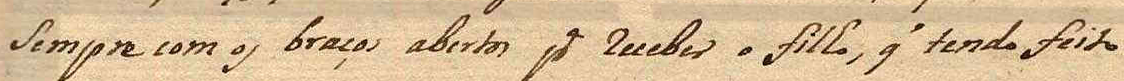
Sempre com os braços abertos pa Receber o filho, q̄ tendo feito
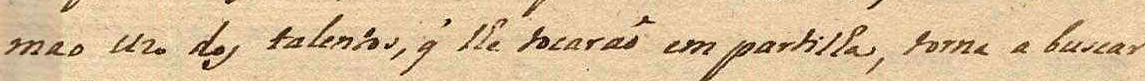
mao uzo dos talentos, q̄ lhe tocaraõ em partilha, torna a buscar
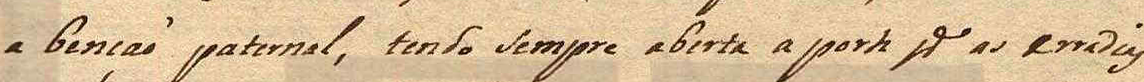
a bençaõ paternal, tendo sempre aberta a porta p.a as erradias
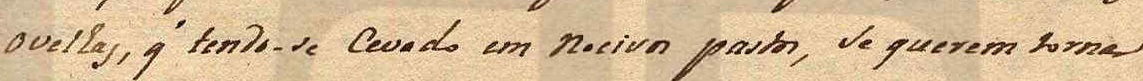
ovelhas, q̄ tendo-se cevado em nocivos pastos, se querem tornar
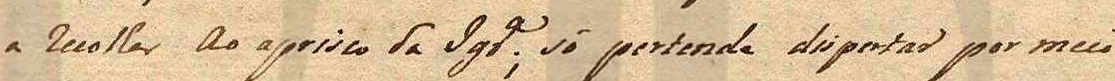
a Recolher ao aprisco da Igr.a; só pertende dispertar por meio
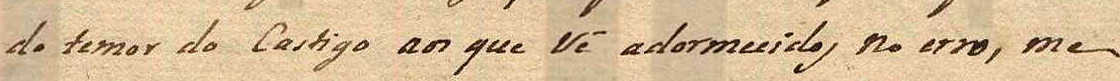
do temor do Castigo aos que vē adormecidos no erro, me
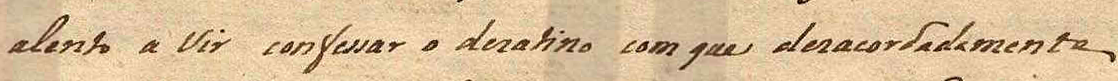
alento a vir confessar o dezatino com que dezacordadamente
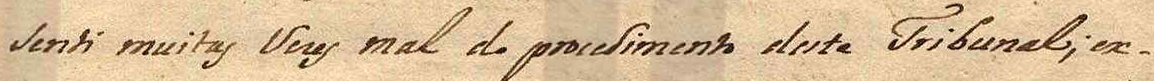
senti muitas Vezes mal do procedimento deste Tribunal, ex
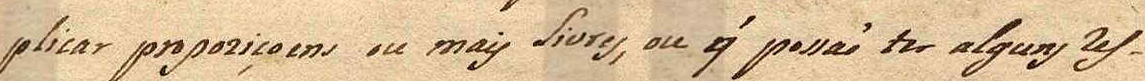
plicar propoziçoens ou mais Livres, ou q̄ possaõ ter alguns Res
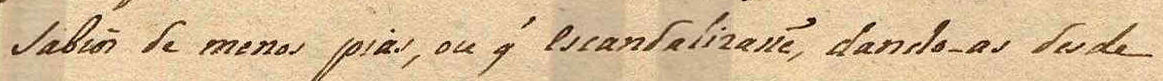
sabios de menos pias, ou q̄ escandalizassē, dando-as desde
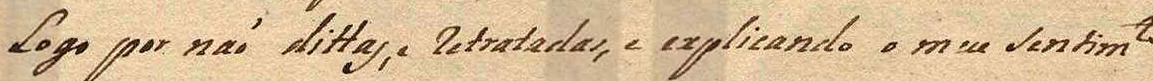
Logo por naõ dittas, e Retratadas, e explicando o meu Sentim.to
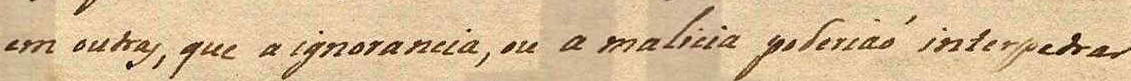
em outras, que a ignorancia, ou a malicia poderiaõ interpetrar
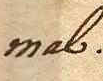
mal.
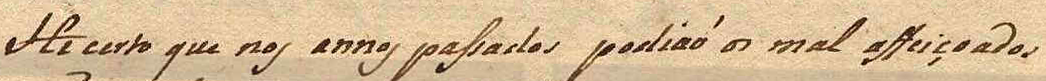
He certo que nos annos passados podiaõ os mal affeiçoados
